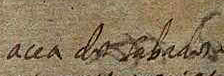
a cea dos sabados
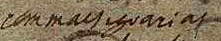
com mais igoarias
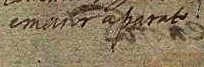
e maior aparato.
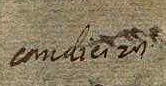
candieiros
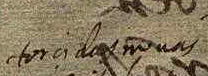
torcidas nouas
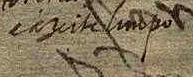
e azeite limpo
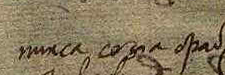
nunca cozia o paõ
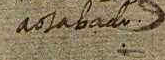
ao sabado.
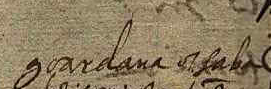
goardaua os saba
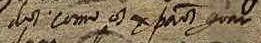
dos como os xpaõs goar
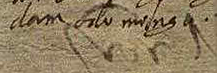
dam o domingo.
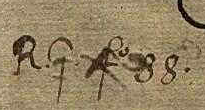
R. q̄. fo 38.
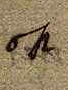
o R.
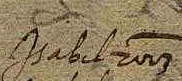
Jsabel roīz
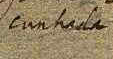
cunhada
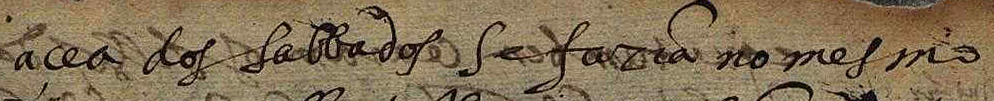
açea dos sabbados se faziā no mesmo
